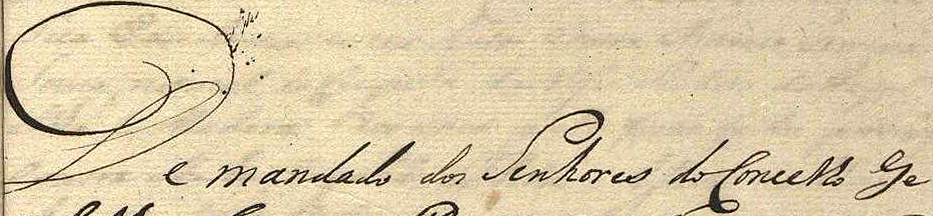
De mandado dos Senhores do Concelho Ge
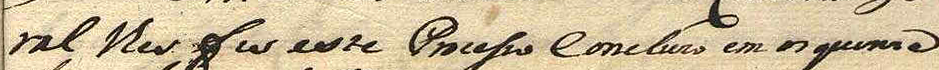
ral lhes fis este Processo Concluzo em os quinze
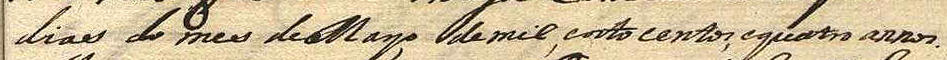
dias do mes de Mayo de mil, e oitocentos, e quatro annos.
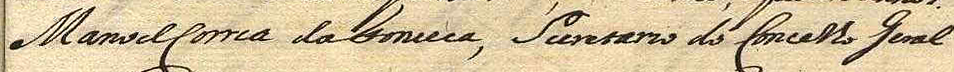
Manoel Correa da Fonceca, Secretario do Concelho Geral
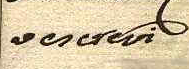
o escrevi
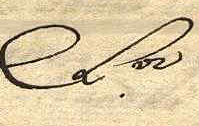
CL.oz
